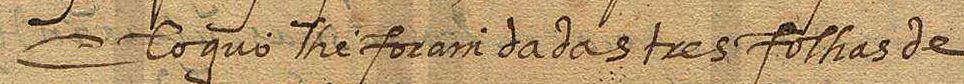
e loguo lhe foram dadas tres folhas de
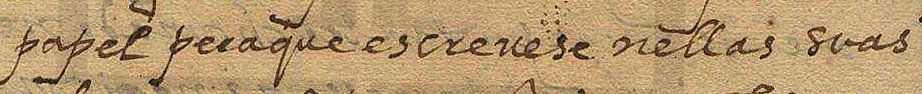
papel pera que escreuese nellas suas
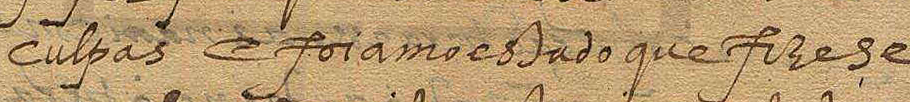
culpas e foi amoestado que fizese
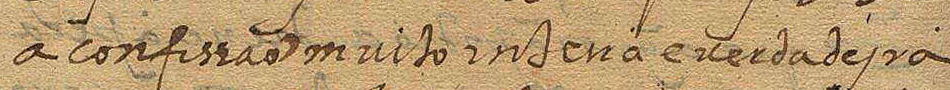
a confissão muito inteira e uerdadejra
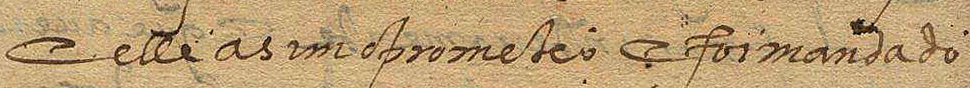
e elle asim o prometeo e foi mandado
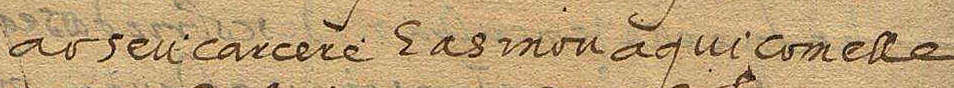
ao seu carcere E asinou aqui com elle
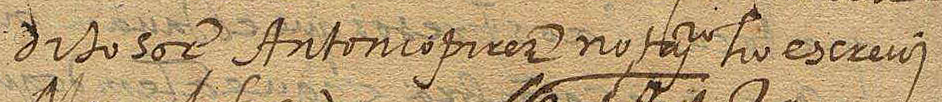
dito sor̄ Antonio pirez̄ notajro ho escreuj
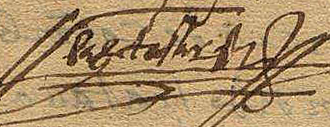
baltasar frz
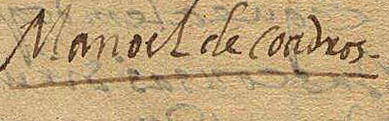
Manoel de coadros
